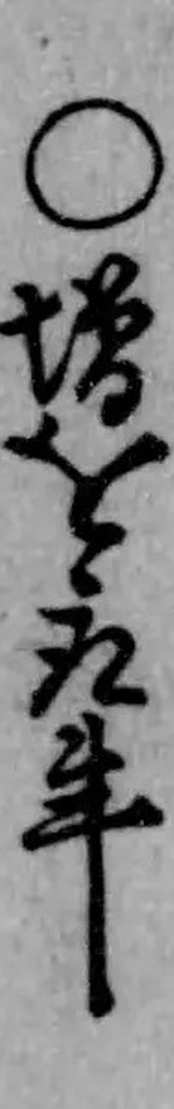○増を取事
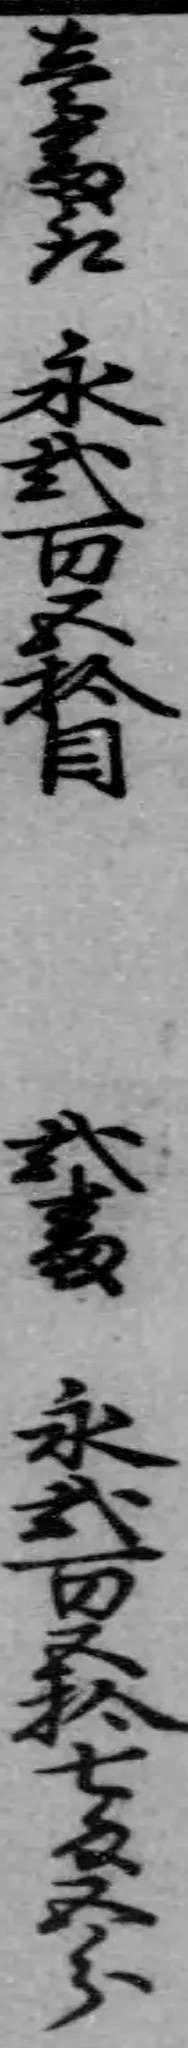壱番取永弐百五拾目弐番永弐百五拾七匁五分
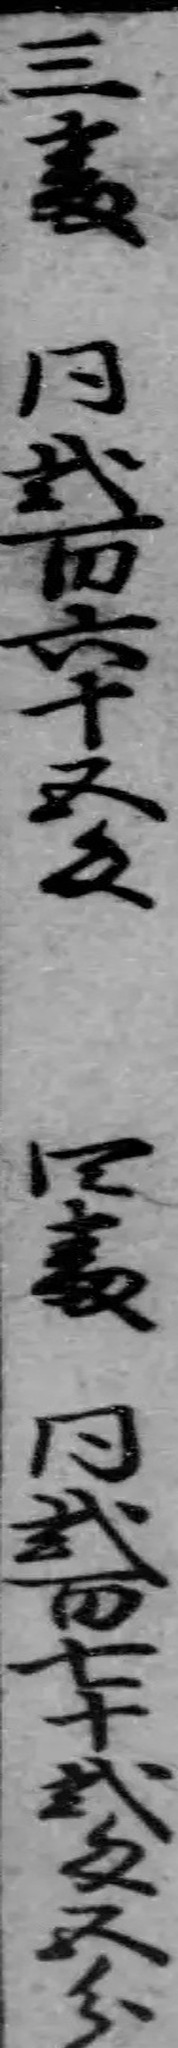三番同弐百六十五匁四番同弐百七十弐匁五分

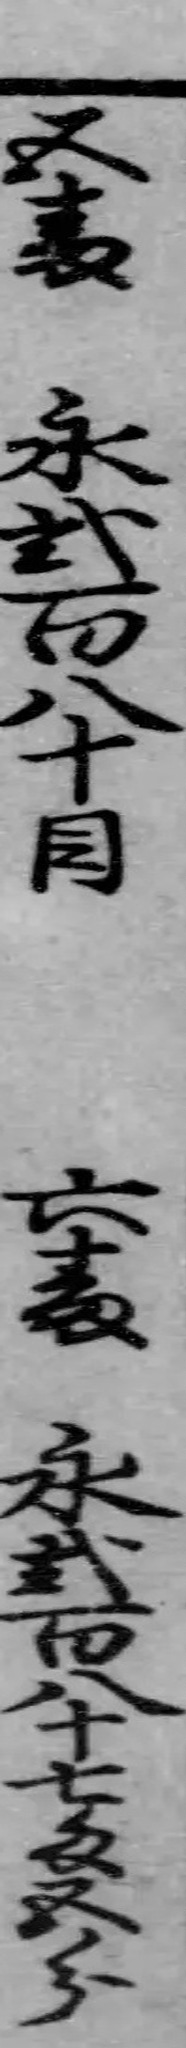五番永弐百八十目六番永弐百八十七匁五分
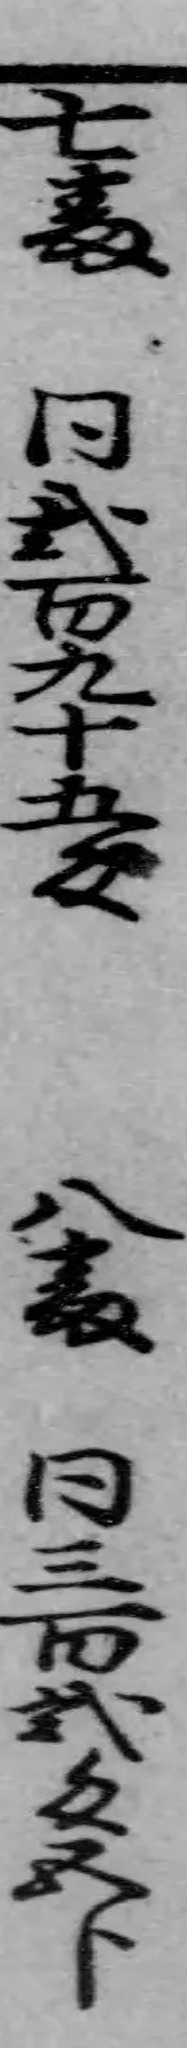七番同弐百九十五匁八番同三百弐匁五分
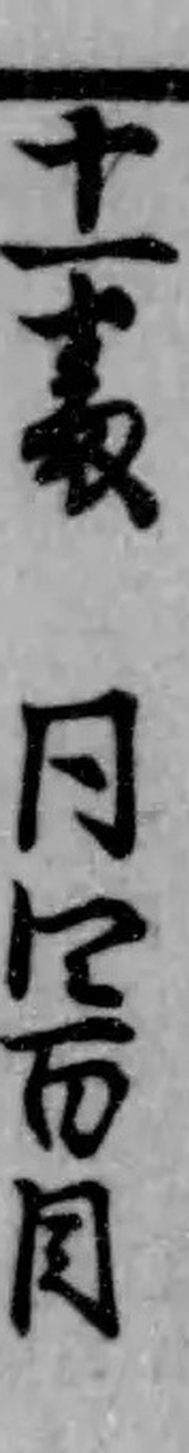十一番同四百目
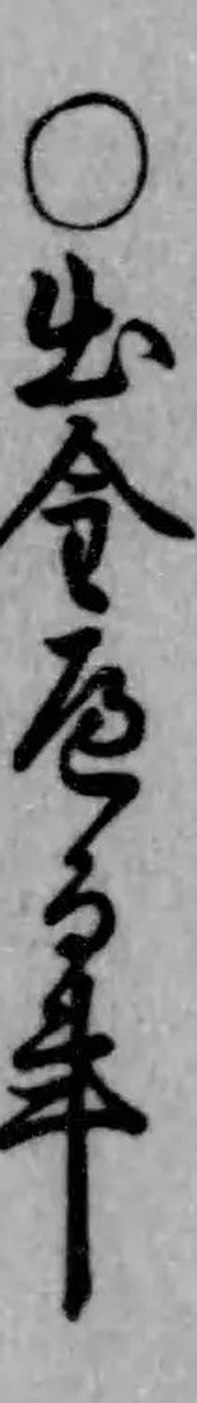○出金へる事
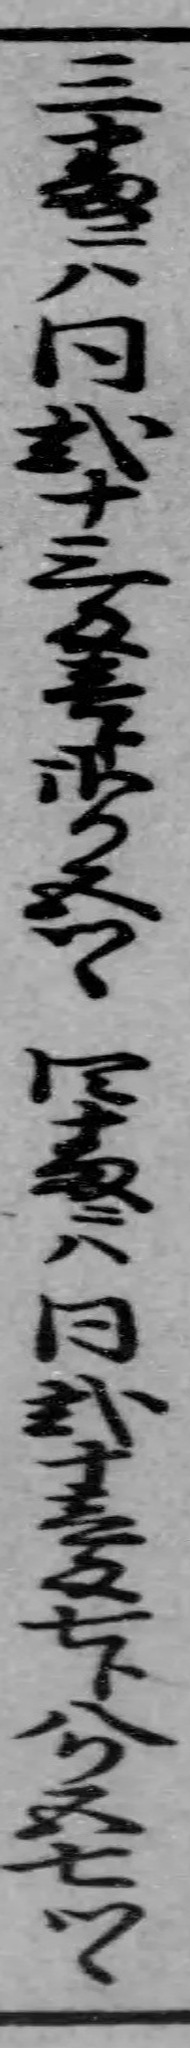三番には同弐十三匁壱分弐り五つゝ四番には同弐十壱匁七分八り五七ツゝ
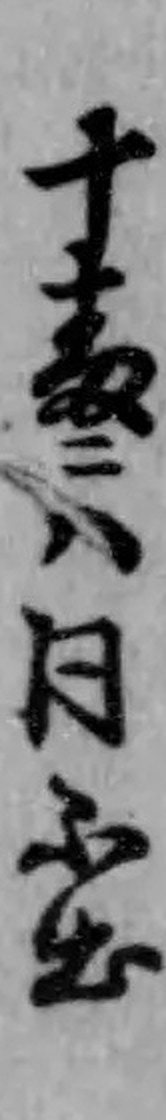十一番には同不出
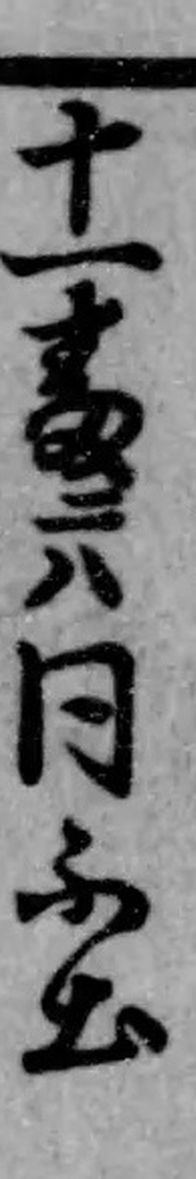十一番には同不出
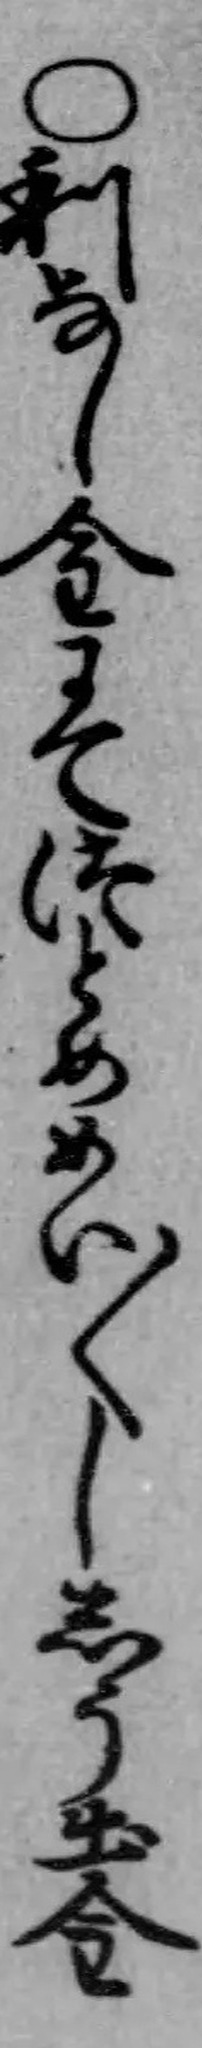○利なし金にてつとめめい〳〵ししう出金
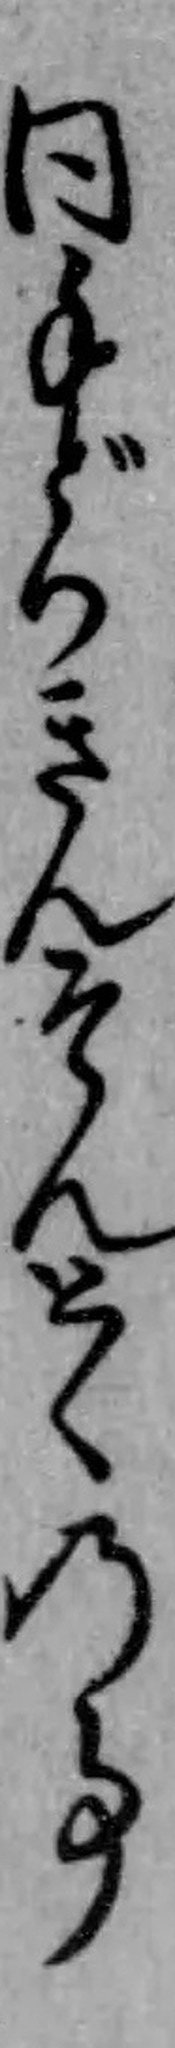同手どりきんそんとくの事
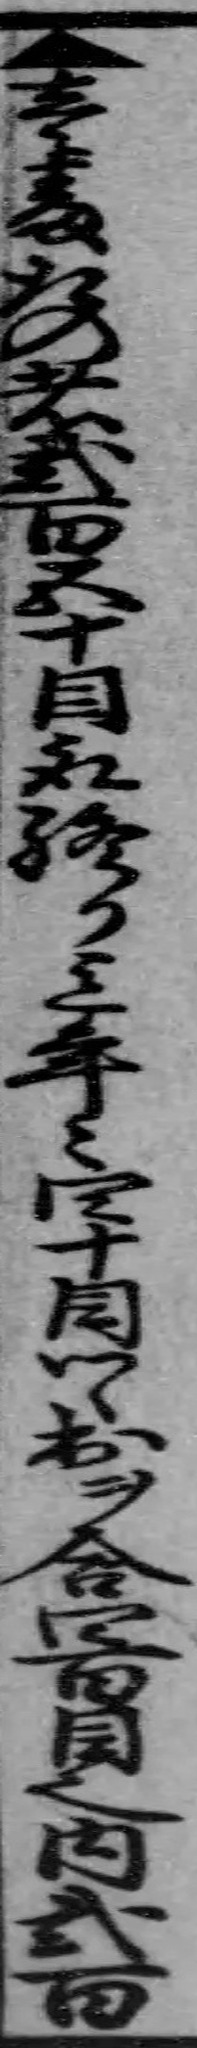▲壱番取の者弐百五十目取終り迄年々四十目つゝ出を合四百目也内弐百
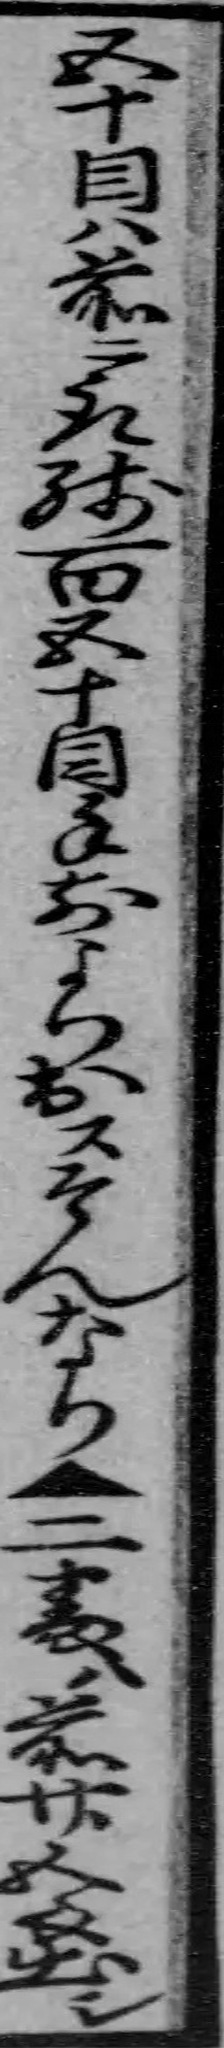五十目は前に取残百五十目手前より出すそんなり▲二番は前廿五匁出し
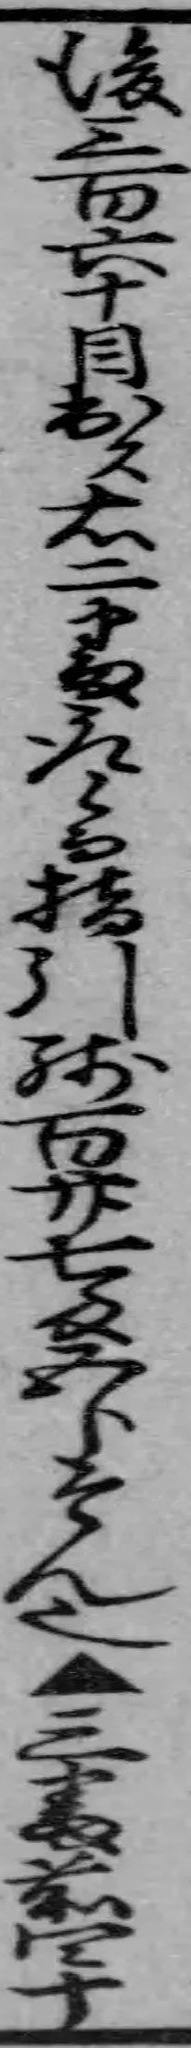後三百六十目出す右二番取候而指引残百廿七匁五分そん也▲三番前四十
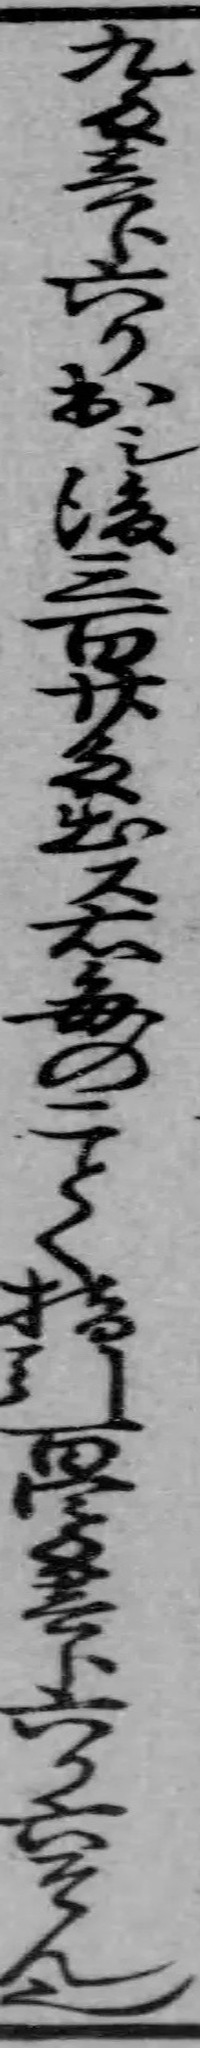九匁壱分六り出し後三百廿匁出す右毎のことく指引百四匁壱分六り六そん也
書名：長崎むじん物語 大正15 米山堂
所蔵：国立国会図書館 National Diet Library, JAPAN
